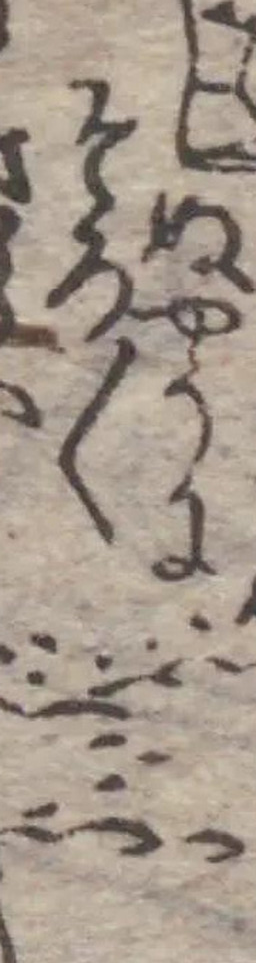そろ〳〵
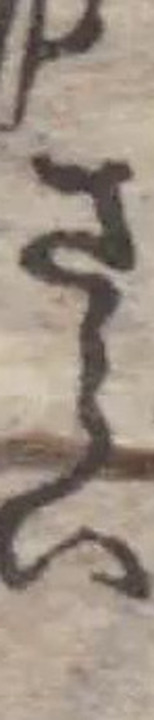さらい
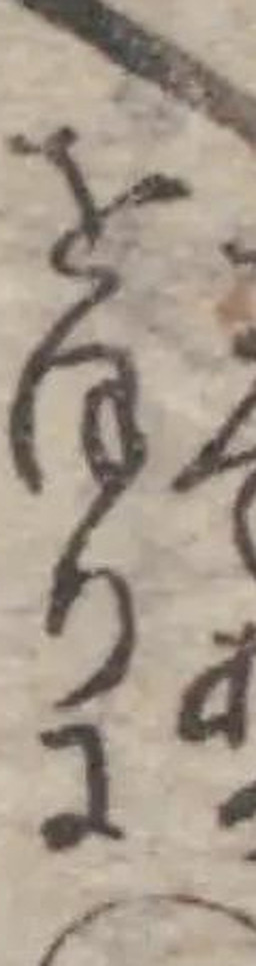をほりに
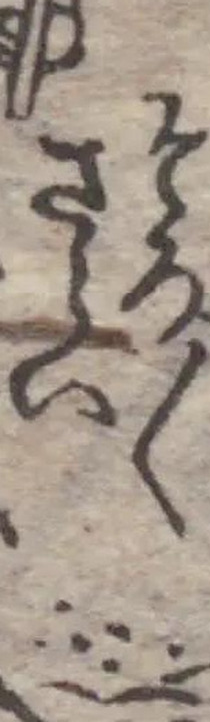さらい
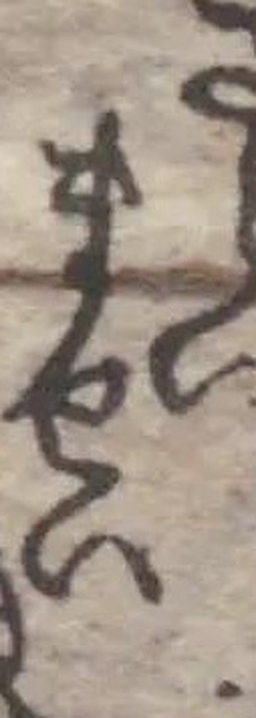ませい
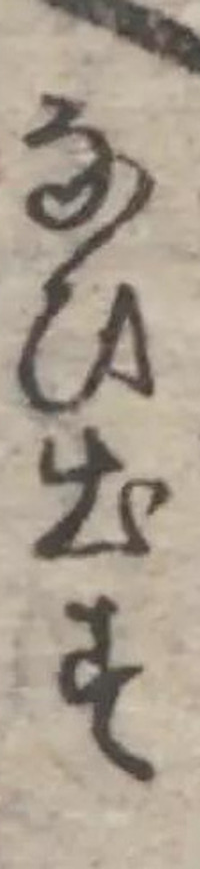なひ出す
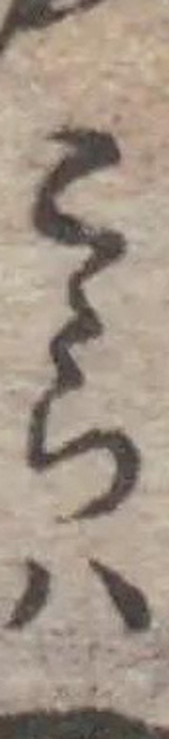こゝらは
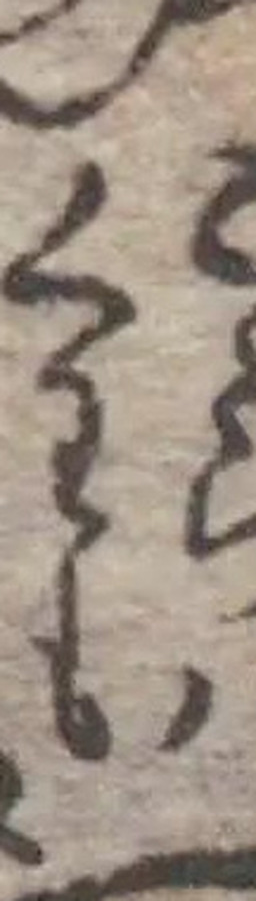くわも
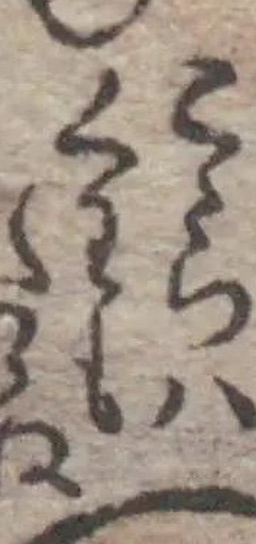くわも
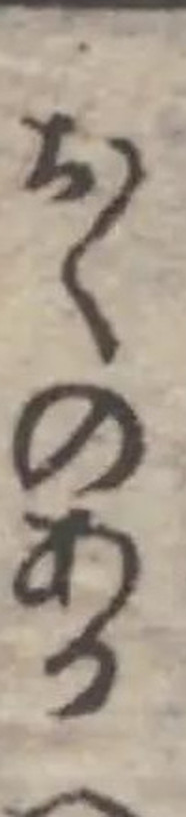おくのあか
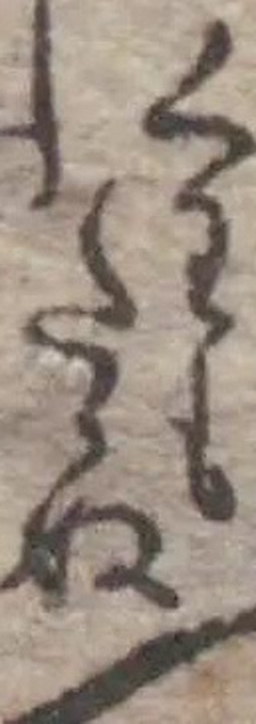たゝぬ
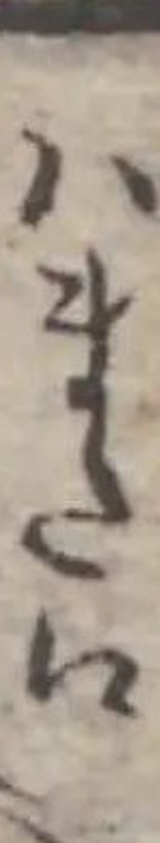はまた口
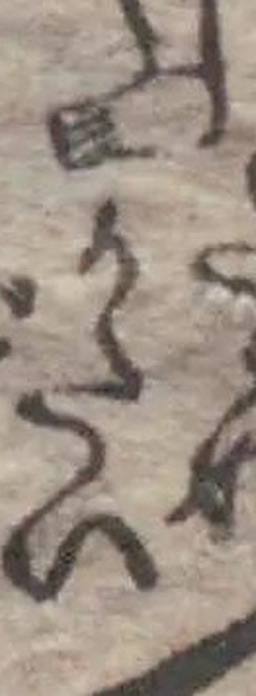かたい
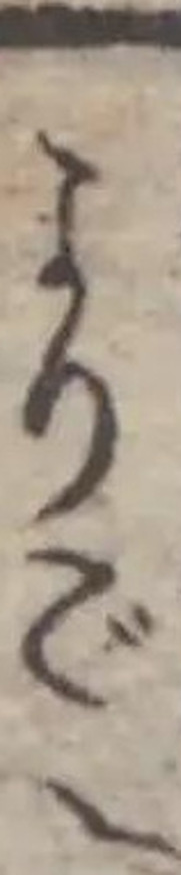よりご
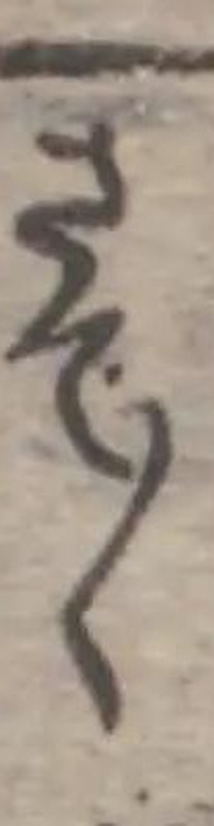さて〳〵
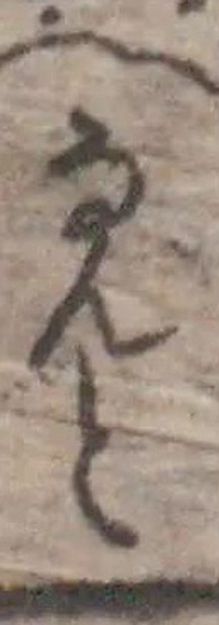なんと
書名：五たいそう
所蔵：国立国会図書館 National Diet Library, JAPAN
